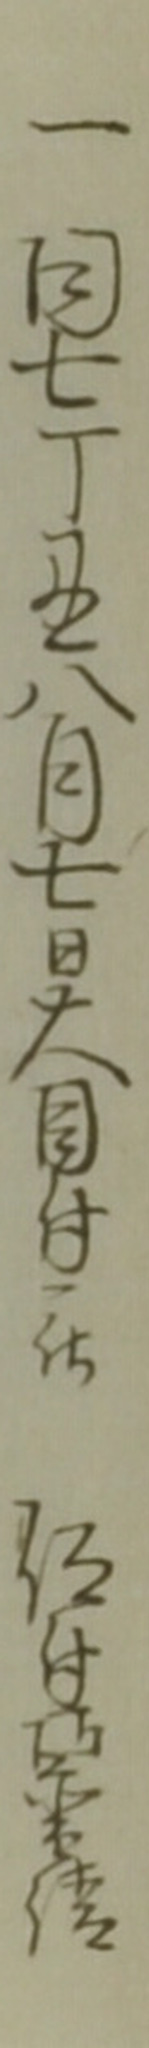一同七丁丑八月七日大目付被仰付御普請
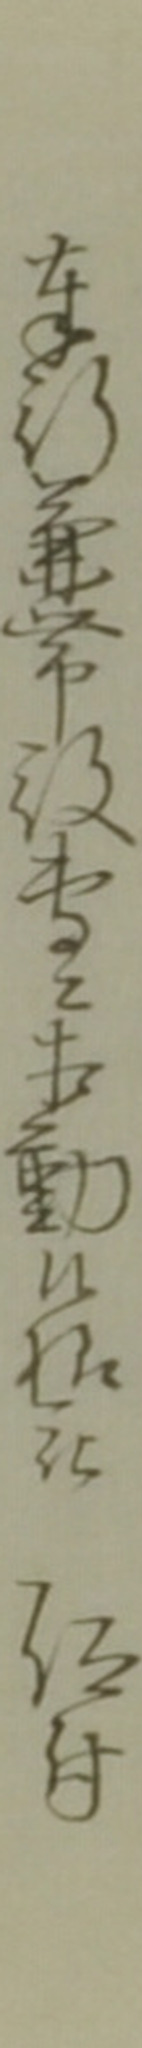奉行兼帯役専ニ相勤候様被仰付候
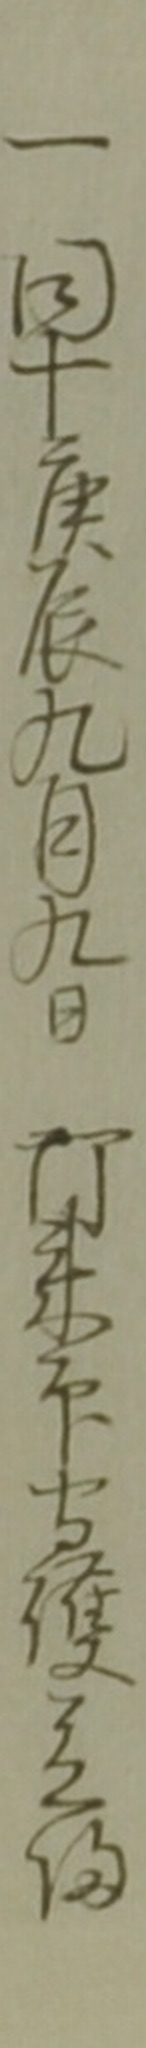一同十庚辰九月九日御朱印守護立帰
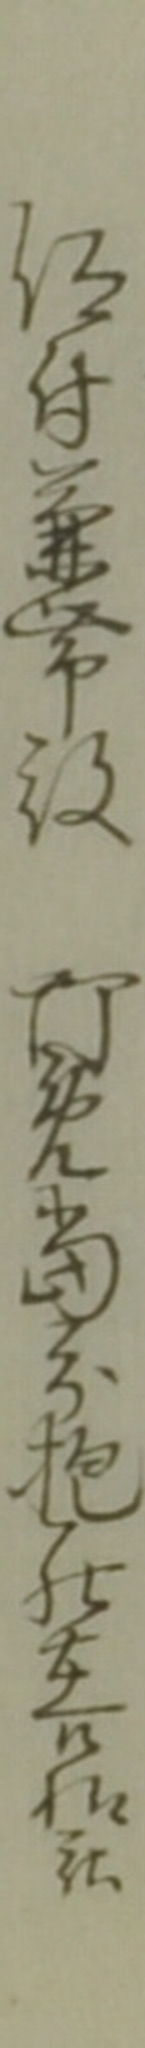仰付兼帯役御免当分抱罷在候様被
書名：給人諸士勤仕録（三）
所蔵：伊那市立高遠町図書館・合同会社AMANE
